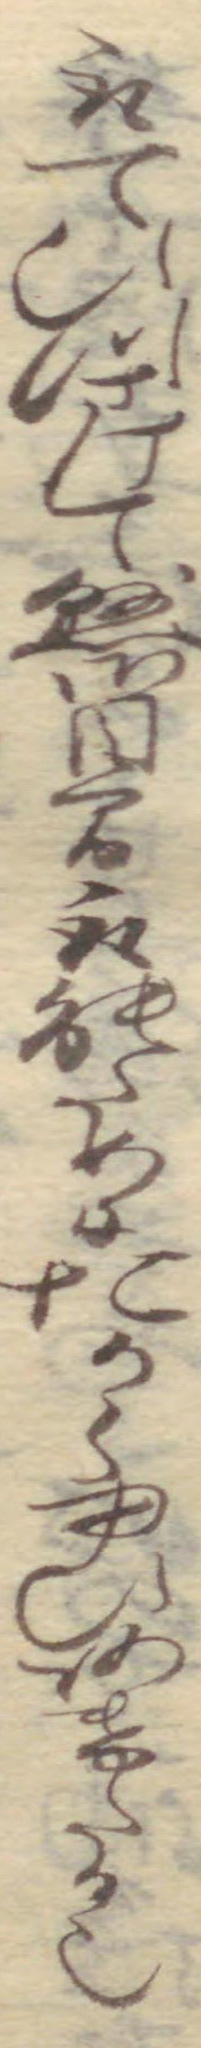取てひつさけて懸御目間取能ためにたかくゆひあけたる也
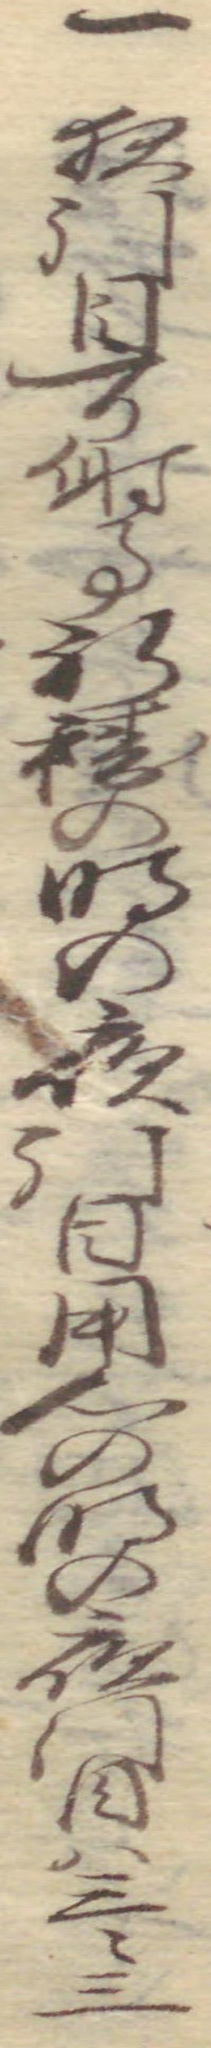一夜引目可射事祈祷の時の夜引目用心の時の夜引目ハ三々三
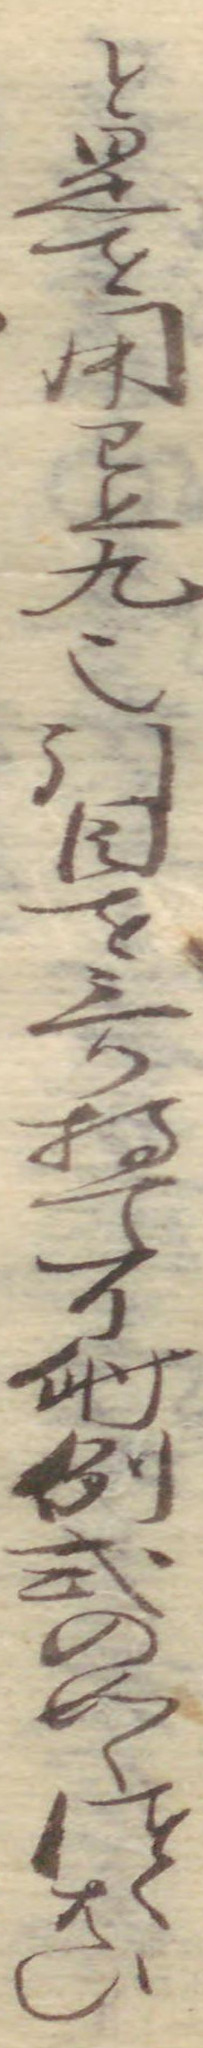と是を用已上九也引目を三ツ持て可射例式の如くつくはひ
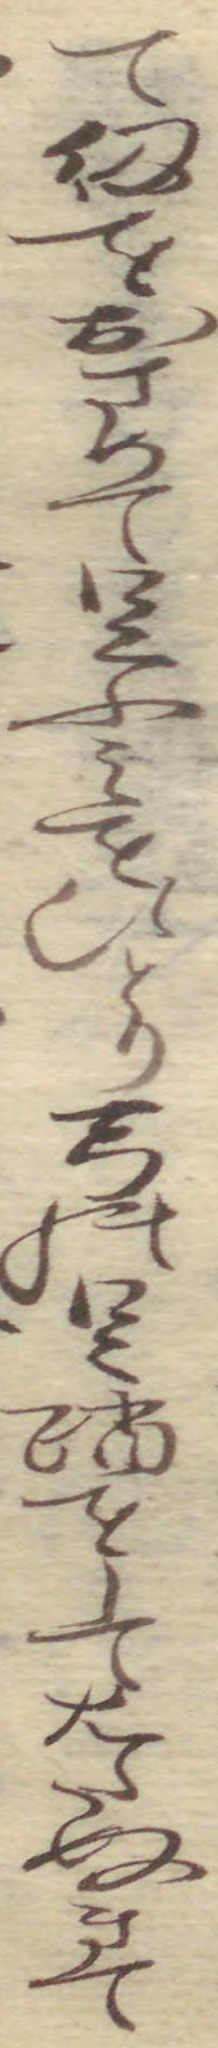て紐をおさめて足ふミをひとり弓の足踏をしてはたぬきて
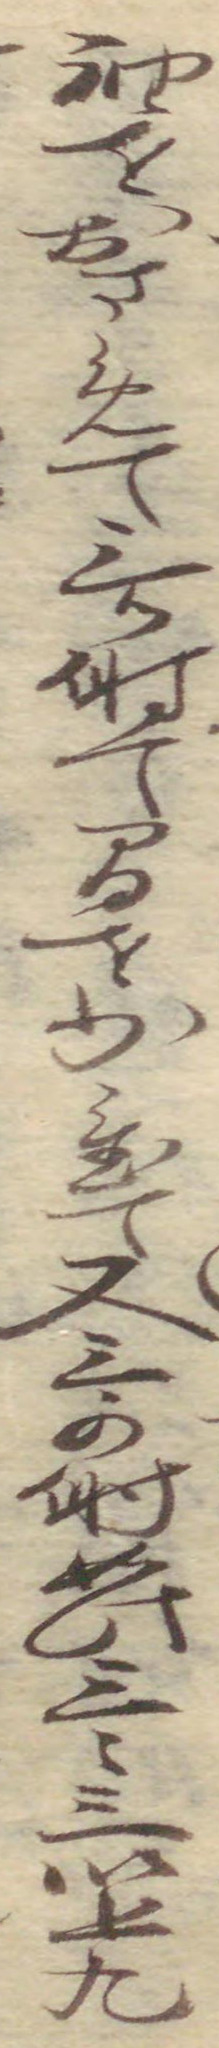袖をおさめて三ツ射て間を少おき置て又三可射如此三々三以上九
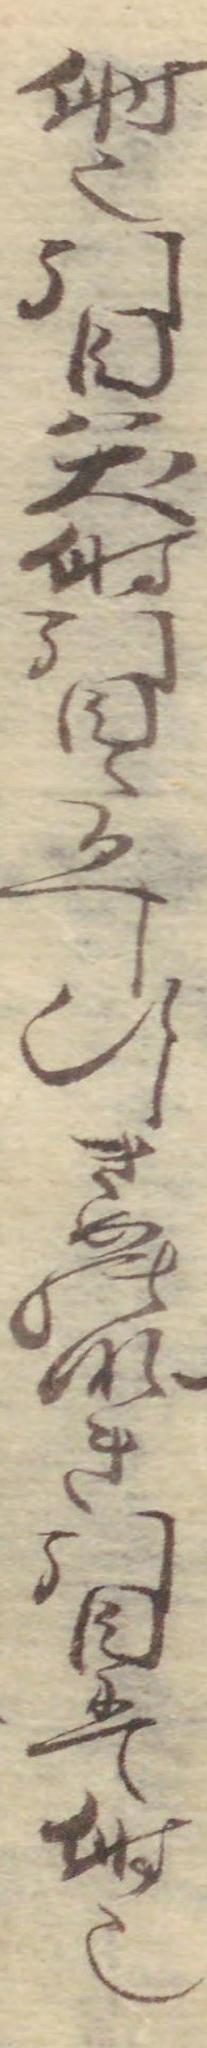射也引目ハ犬射引目たるへしひしきめのなき引目にて射也
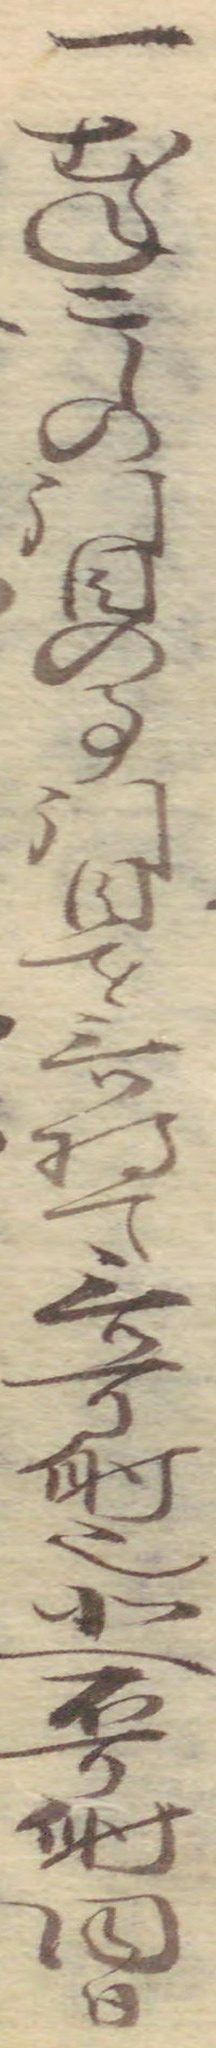一むねこしの引目の事引目を三ツ持て三ツ可射也北へ不可射同日
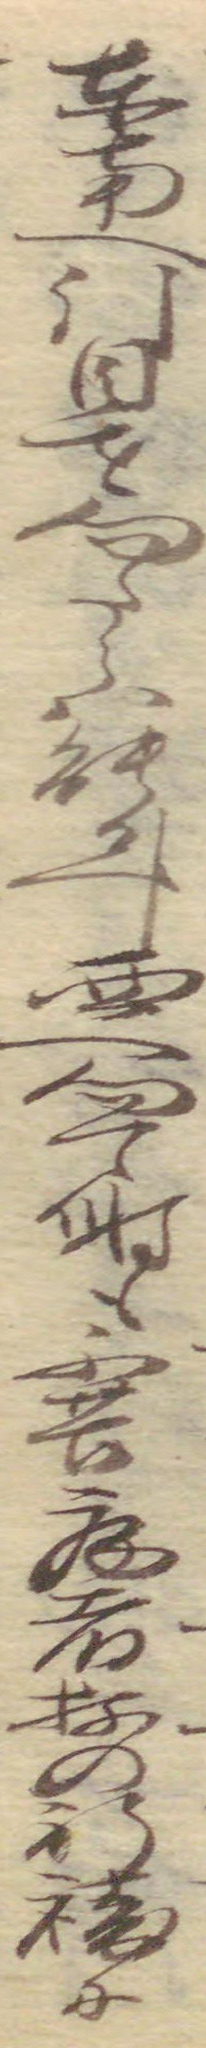東南へ引目を向たらハ能るへし西へ向て射も不苦病者抔の祈祷に
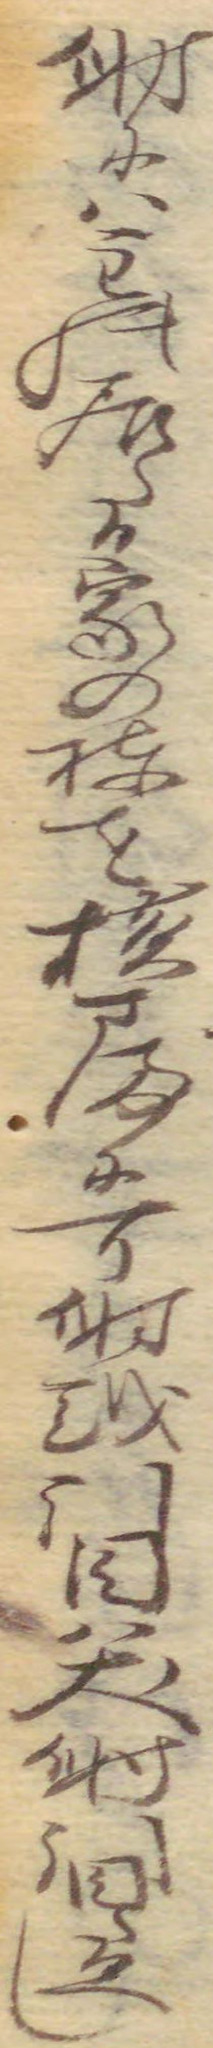射にハ主の居たる家の棟を横さまに可射越引目ハ犬射引目たるへし

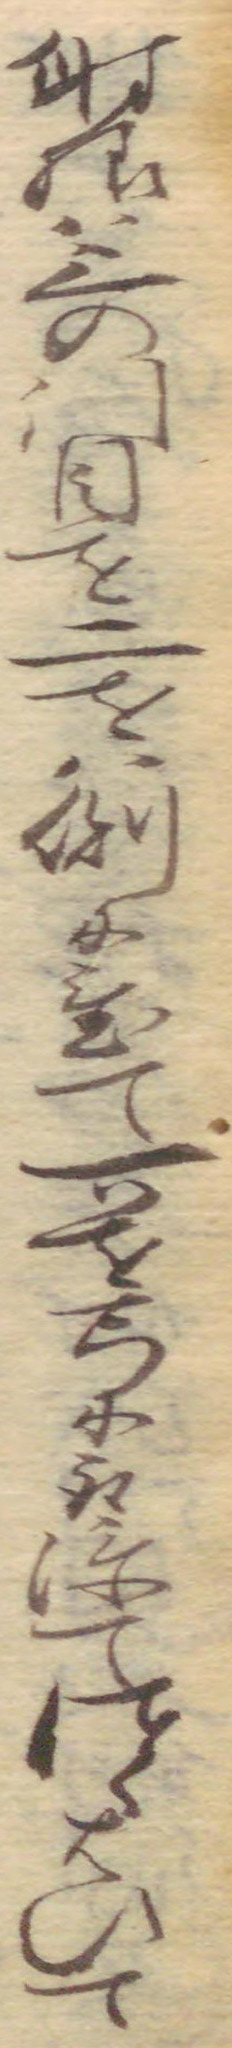射様ハ三の引目を二をハ側に置て一ツを弓に取添てつくはひて
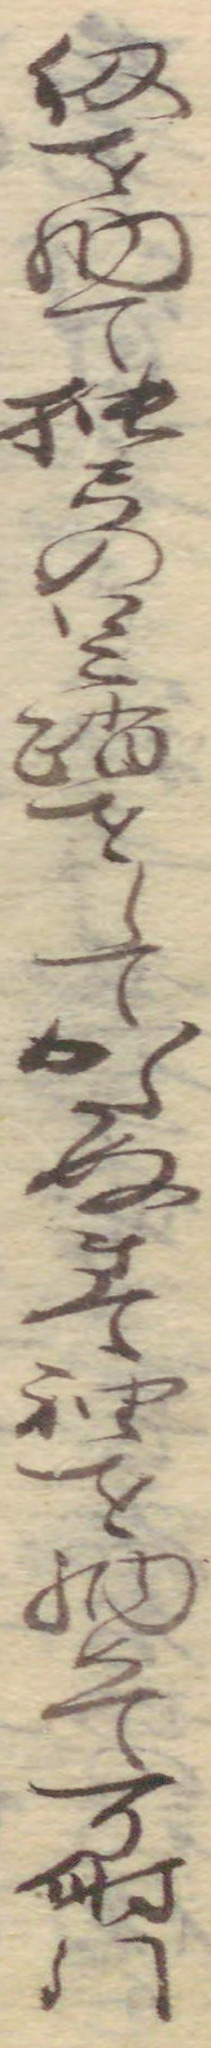紐を納て独弓の足踏をしてかたぬきて袖を納めて可射引
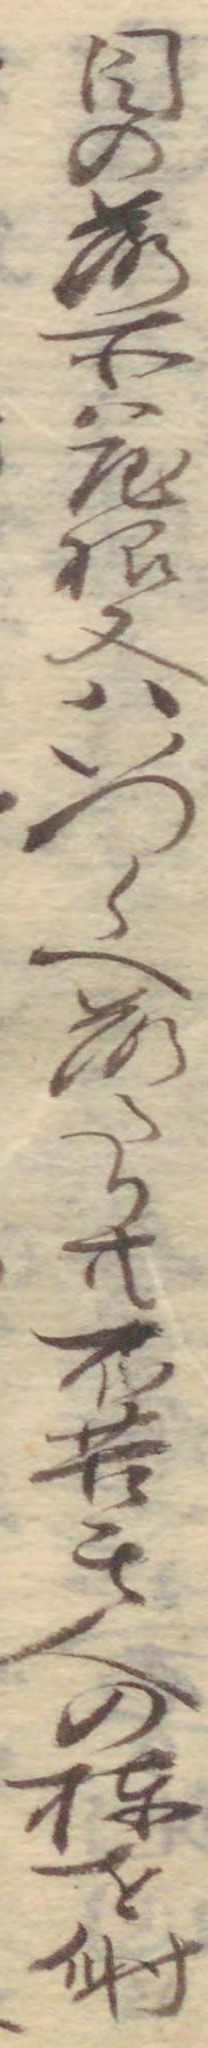目の落所ハ屋根又ハいつくへ落たり共不苦其人の棟を射
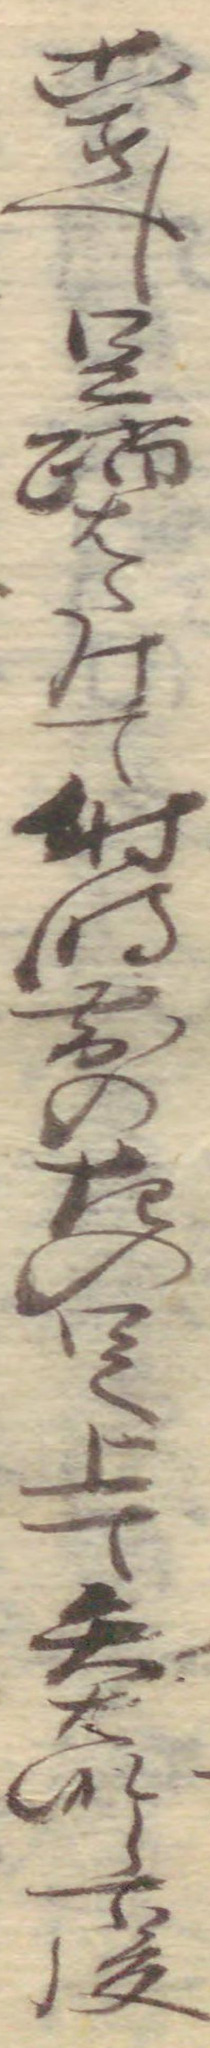こすへし足踏はたけて射時前の左の足上て矢はなして後
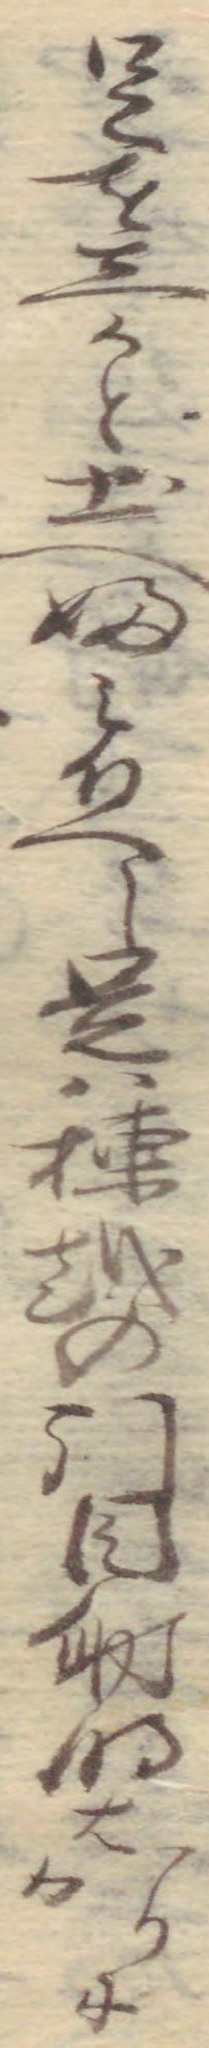足をしかと土へふミ付へし是ハ棟越の引目射時はかりに
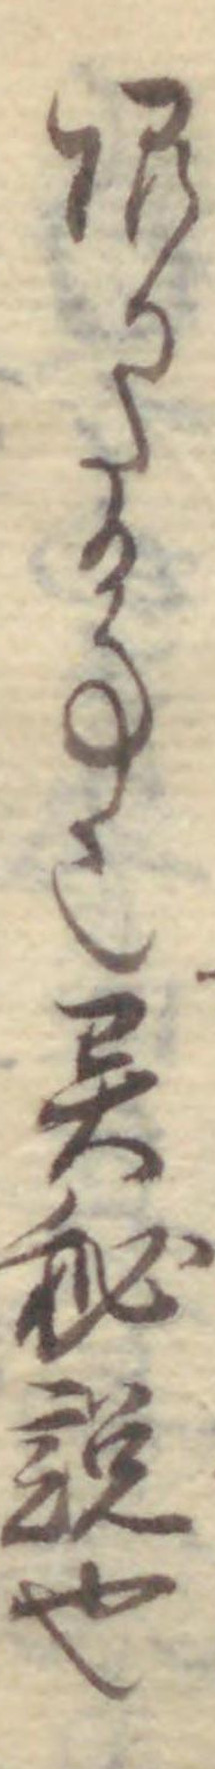限りたる事也異秘説也
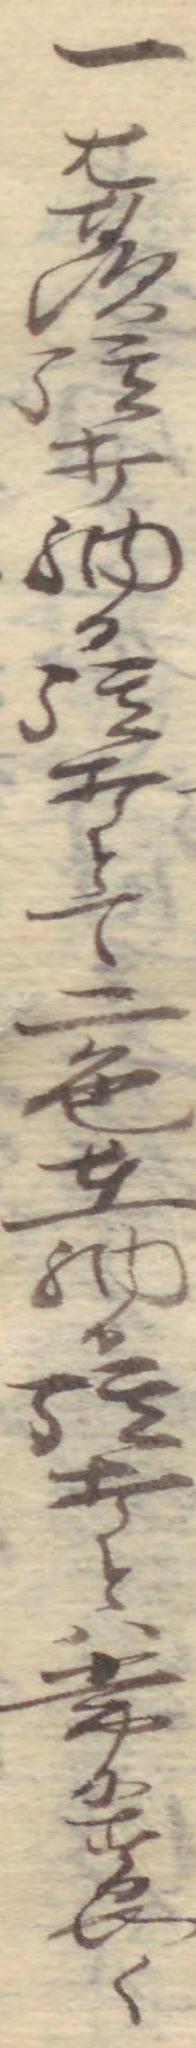一はなす弦打納る弦打とて二色在納る弦打とは常にする如く
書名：鶯宿雑記. 巻199-200
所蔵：国立国会図書館 National Diet Library, JAPAN
